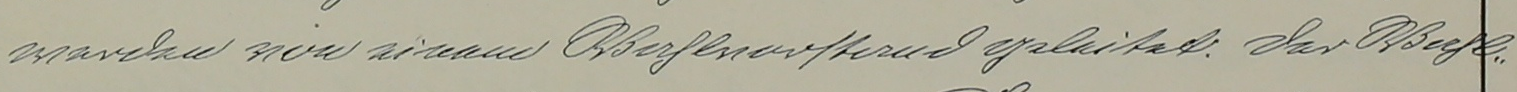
werden von einem Wahlvorstand geleitet. Der Wahl-
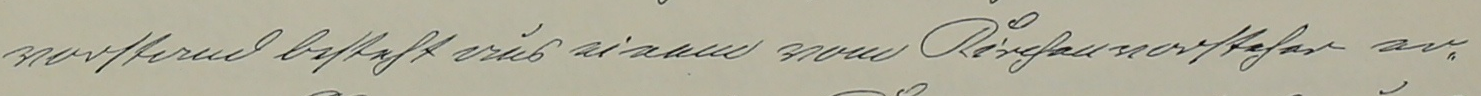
vorstand besteht aus einem vom Kirchenvorsteher er-
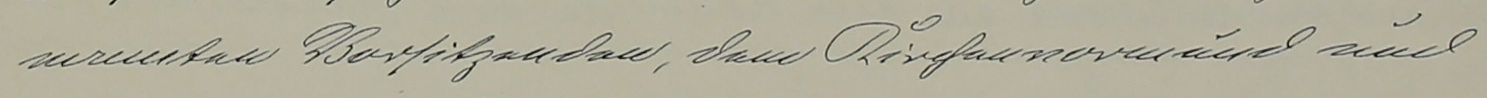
nannten Vorsitzenden, dem Kirchenvormund und
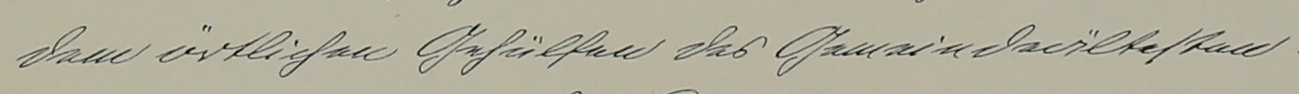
dem örtlichen Gehülfen des Gemeindeältesten.
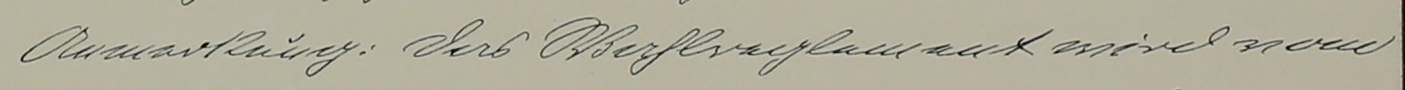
Anmerkung: Das Wahlreglement wird vom
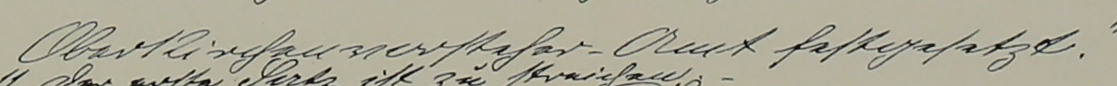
Oberkirchenvorsteher-Amt festgesetzt.“
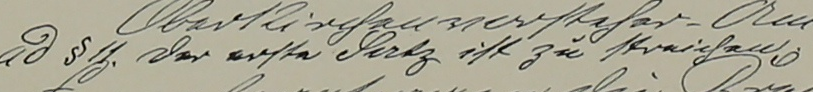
ad § 11. Der erste Satz ist zu streichen.
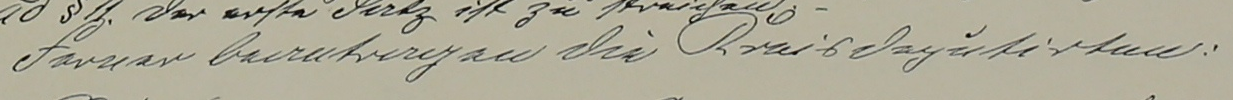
Ferner beantragen die Kreisdeputirten:
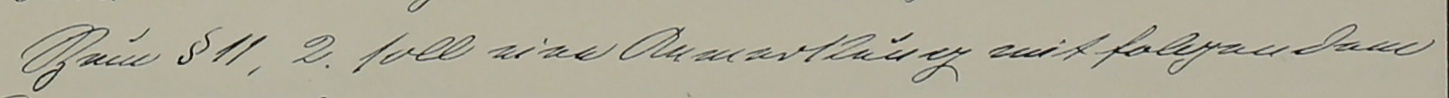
Zum § 11, 2. soll eine Anmerkung mit folgendem
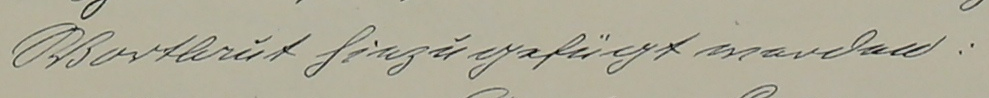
Wortlaut hinzugefügt werden:
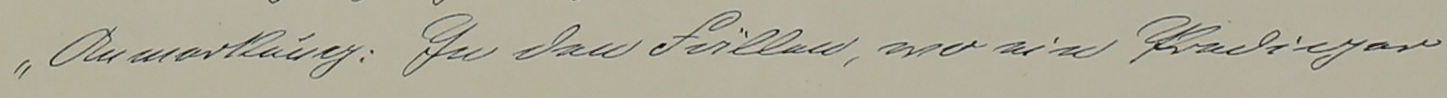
„Anmerkung: In den Fällen, wo ein Prediger
